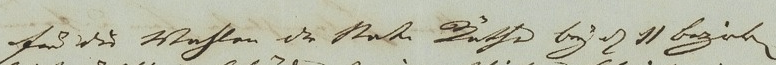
für die Wahlen der Nat.Räthe bey den 11 Bezirken
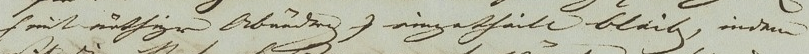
(mit nöthiger Abänderg) eingetheilt bleiben, indem
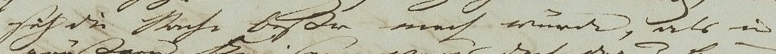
sich die Sache beßer machen würde, als in
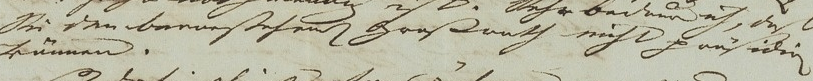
Sie den bevorstehenden Großrath nicht präsidiren
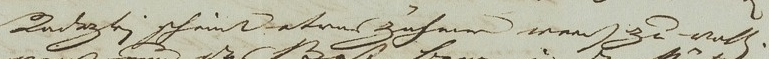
Radezki scheint etwas zähmer werden zu wollen.
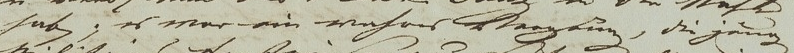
haben; es war ein wahres Vergnügen, die jungen
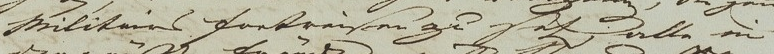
Militairs fortreisen zu sehen, alle in
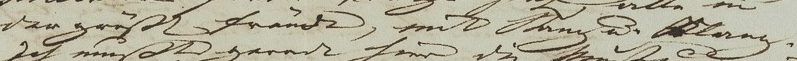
der größten Freude, mit Sang u. Klang.
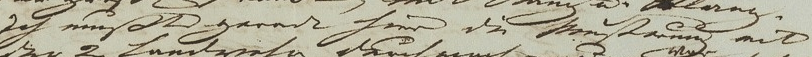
Ich mußte gerade hier die Musterung mit
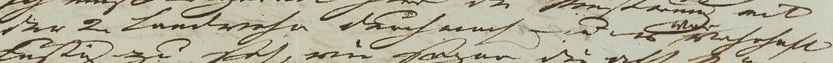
der 2. Landwehr durchmachen u. es war wahrhaft
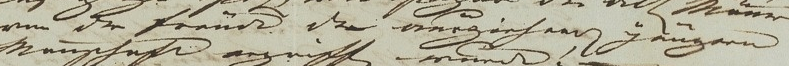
von der Freude der ausziehenden jüngern
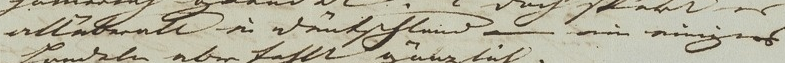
allüberall in Deutschland – ein einiges
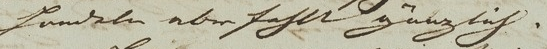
Handeln aber fehlt gänzlich.
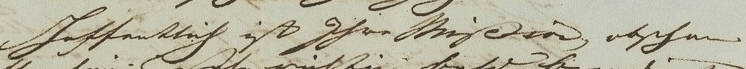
Hoffentlich ist Ihre Mißion, obschon
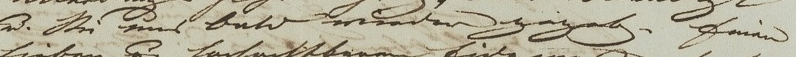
u. Sie uns bald wieder gegeben. Einen
